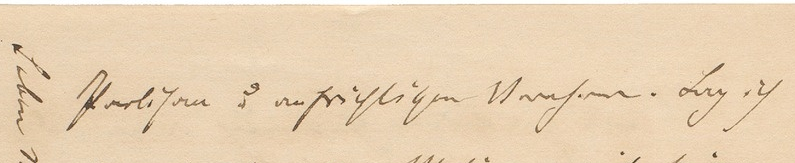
Partisan u aufrichtigen Verehrer. Lag ich
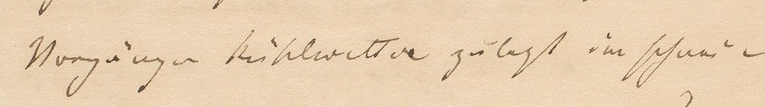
Vorgänger Kühlwetter zulezt im schnei-
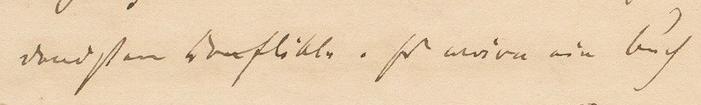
dendsten Konflikte. Es wäre ein Buch
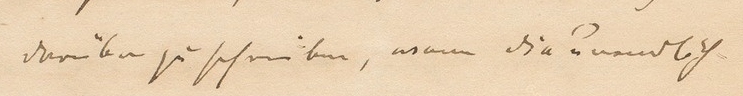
darüber zu schreiben, wenn die unendliche
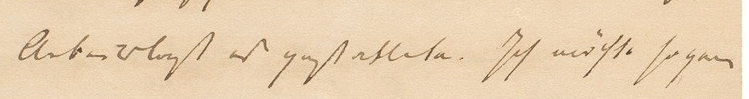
Arbeitslast es gestattete. Ich möchte sogar
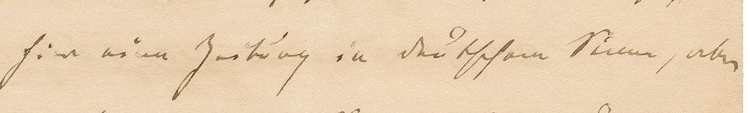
hier eine Zeitung in deutschem Sinne, aber
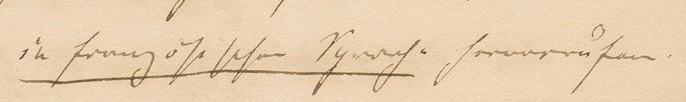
in französischer Sprache hervorrufen.
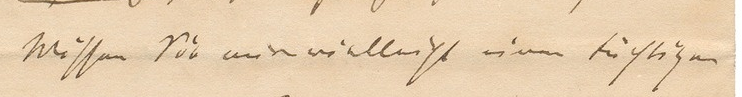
Wissen Sie mir vielleicht einen tüchtigen
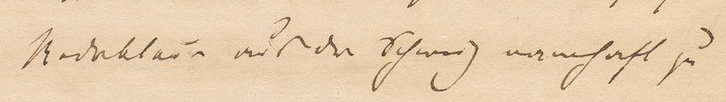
Redakteur aus der Schweiz namhaft zu
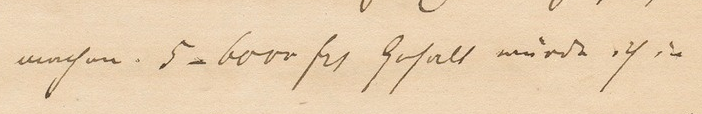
machen. 5–6000 frs Gehalt würde ich in
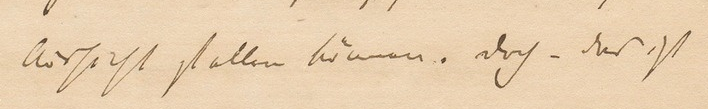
Aussicht stellen können. Doch – das ist
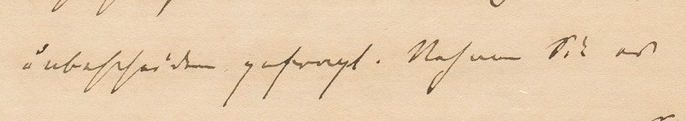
unbescheiden gefragt. Nehmen Sie es
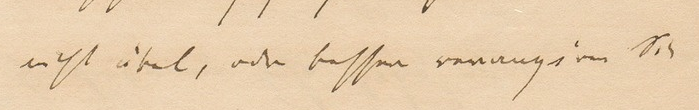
nicht übel, oder besser revangiren Sie
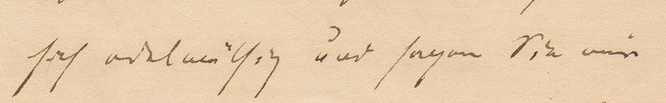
sich edelmüthig und sagen Sie mir
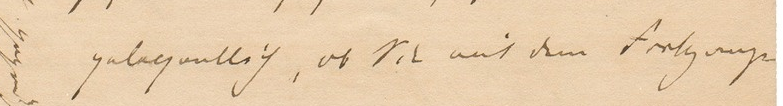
gelegentlich, ob Sie mit dem Fortgange
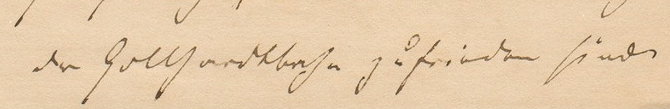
der Gotthardbahn zufrieden sind.
